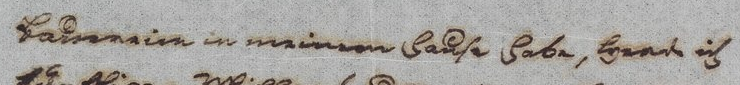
Bauereien in meinem Hause habe, werde ich
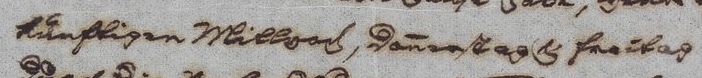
künftigen Mitwoch, Donnerstag & Freitag
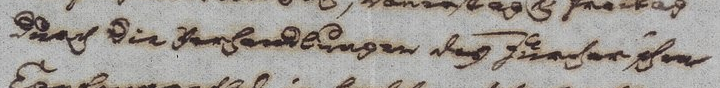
durch die Verhandlungen des Zürcher'schen
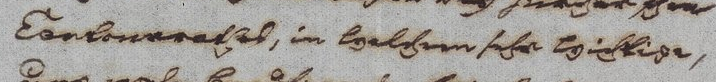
Cantonsrathes, in welchem sehr wichtige,
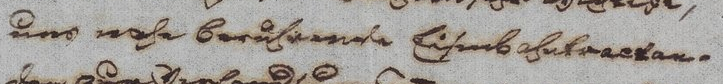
uns nahe berührende Eisenbahntractan-
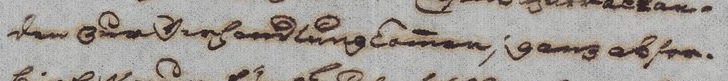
den zur Verhandlung kommen, ganz absor-
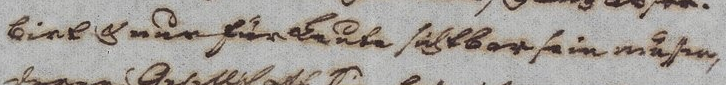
birt & nur für Leute sichtbar sein müssen,
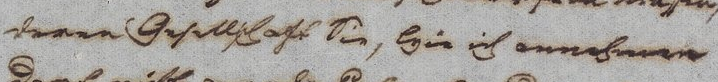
deren Gesellschaft Sie, wie ich annehmen
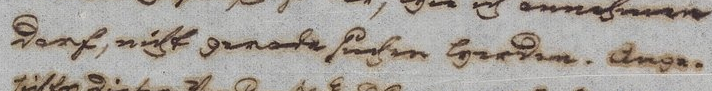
darf, nicht gerade suchen werden. Ange-
